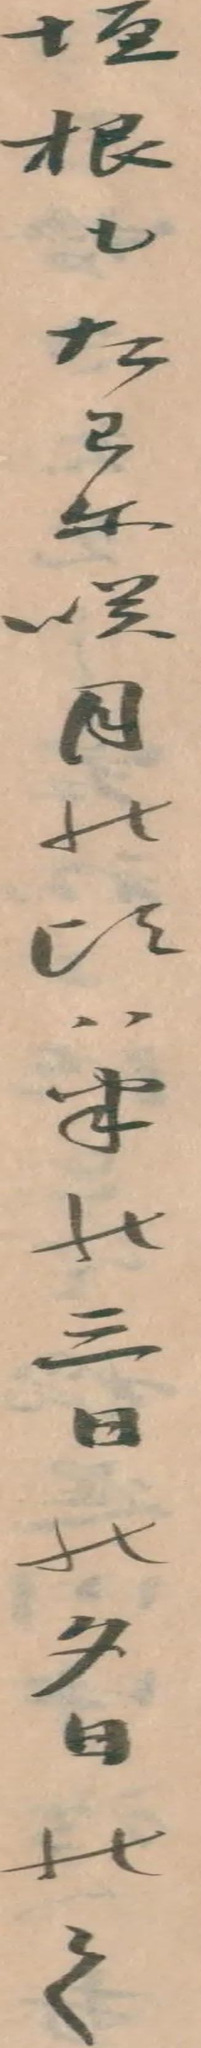垣根もたわに咲月の頃は半の三日の夕日のて

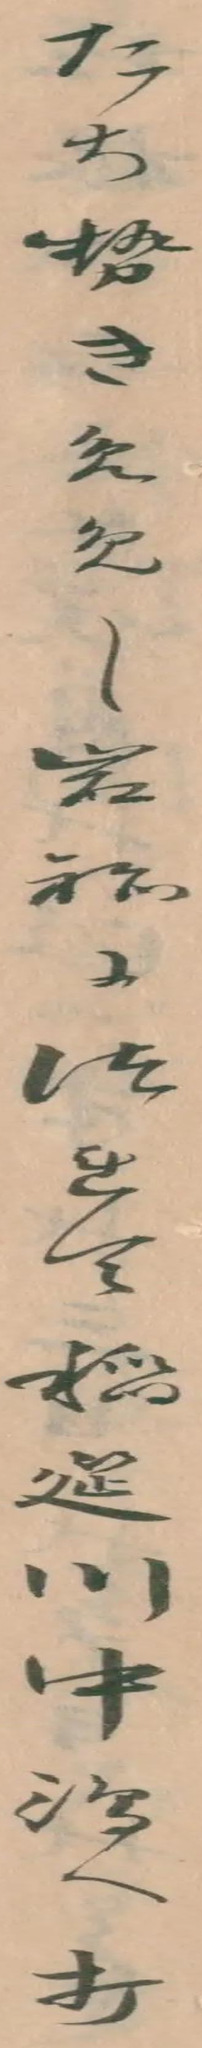たちせきめめし岩ねにつれて稲筵川中嶋へ打
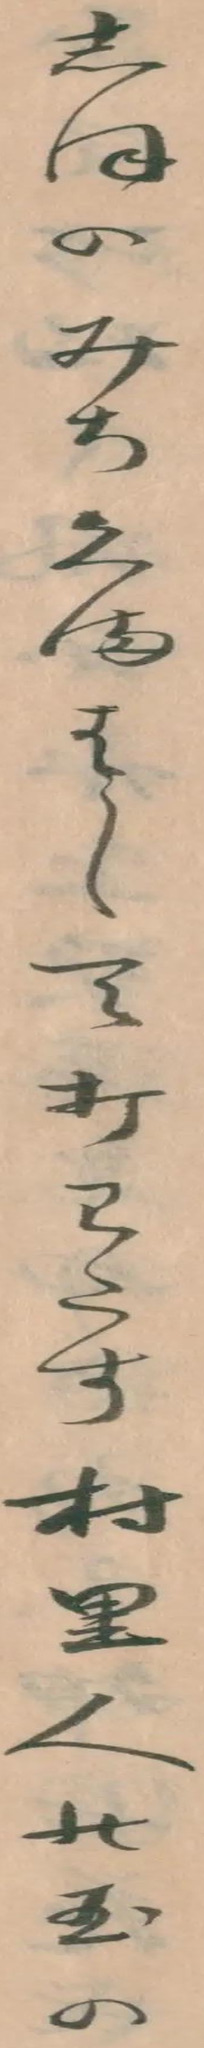しほのみちくまはして打わたす村里人の玉の
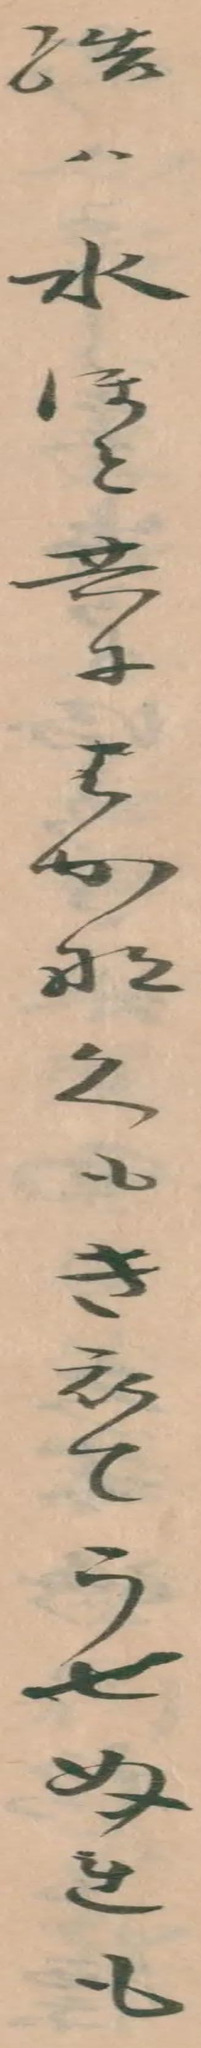緒は水ほと共にはかなくもきえてうせぬれも
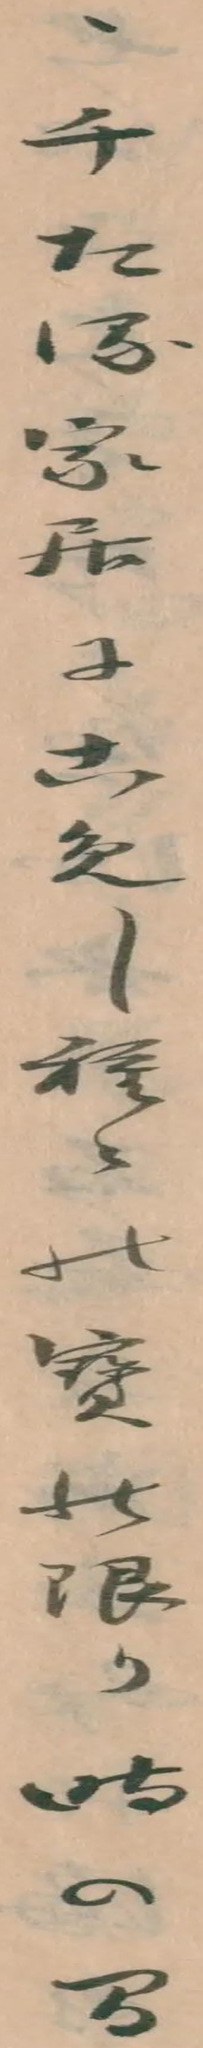ヽチたる家居にこめし程々の宝の限り時の間
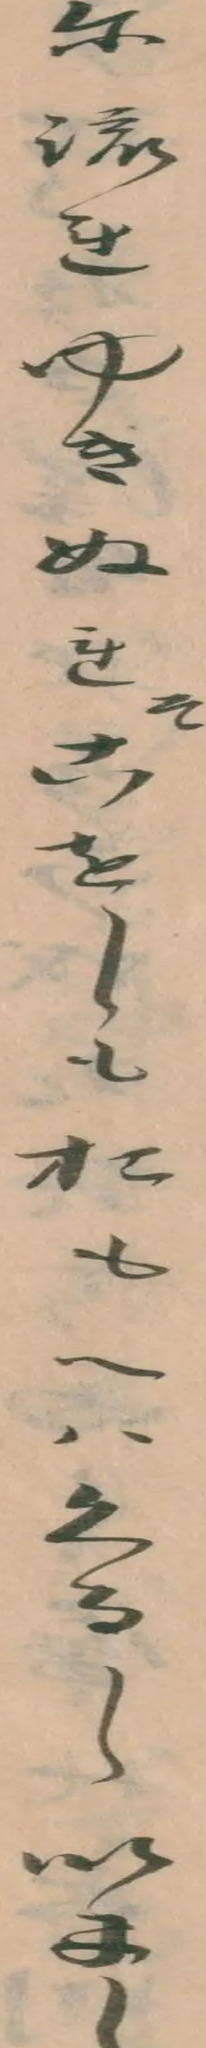に流れゆきぬれそこをしもおもへはくるしいにし
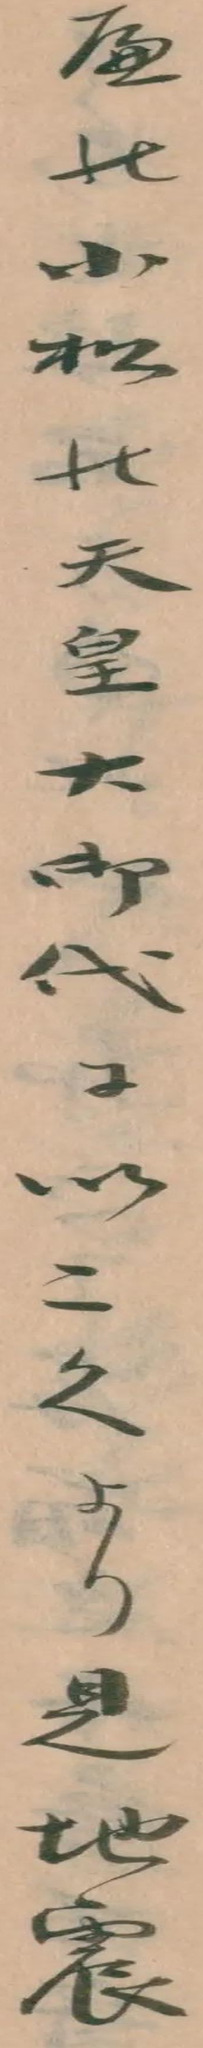への小松の天皇大御代にいこくより見地震
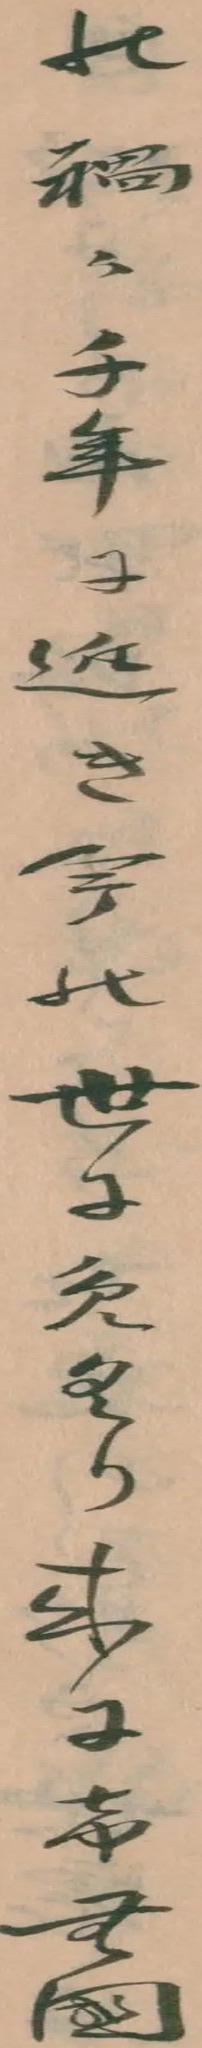の禍か千年に近き今の世にめくり来にけむ国
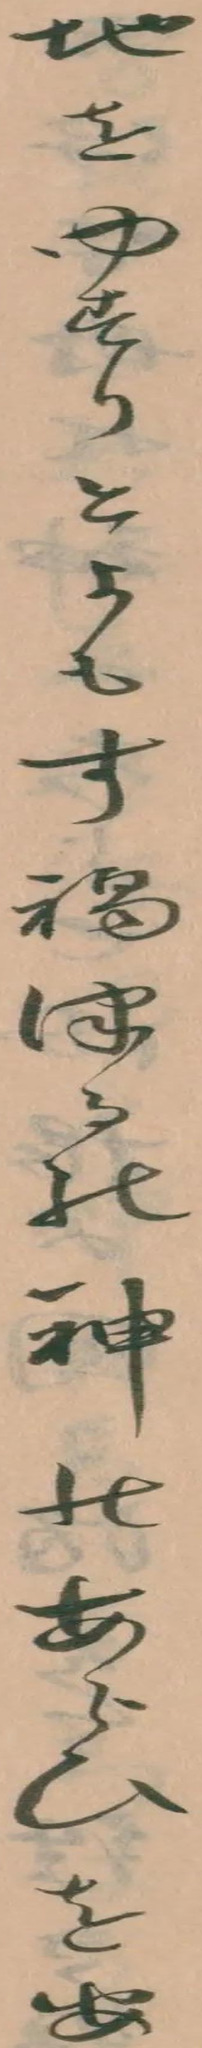地をゆすりとよもす禍つ日の神のあらひをあ
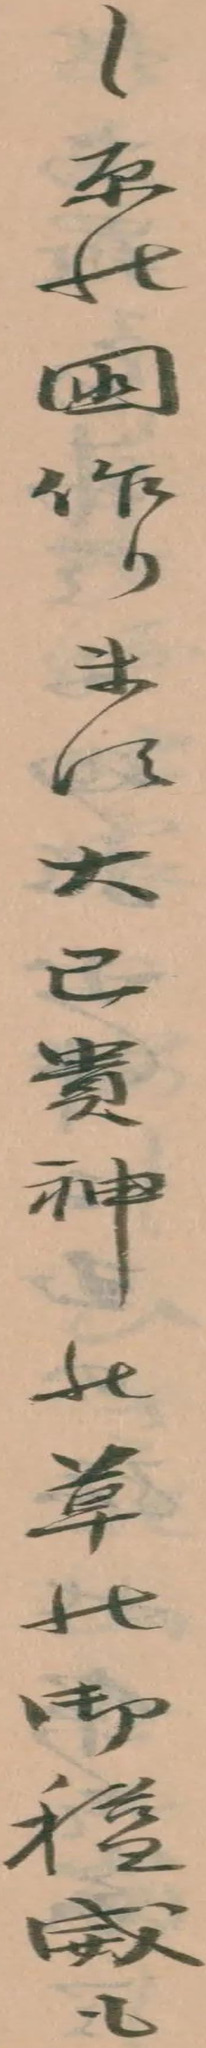し原の国作ります大己貴神の草の御稜威も
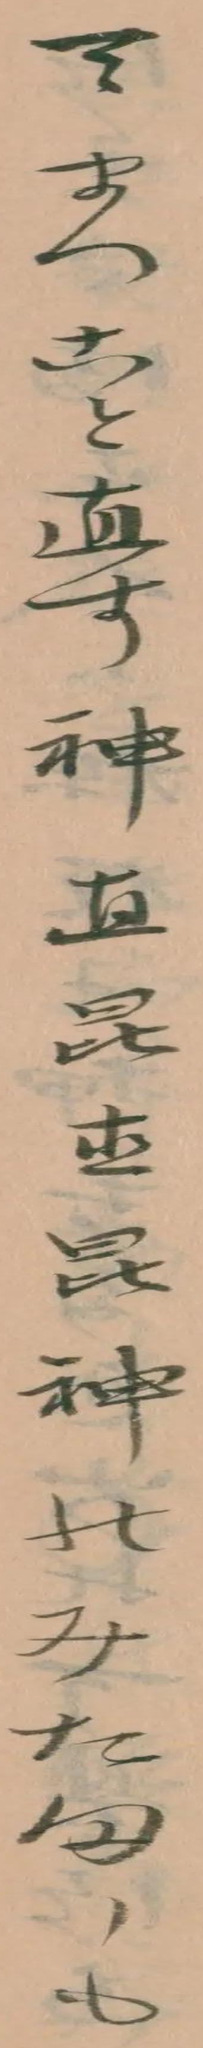てまつこと直す神直昆直昆神のみたまのも
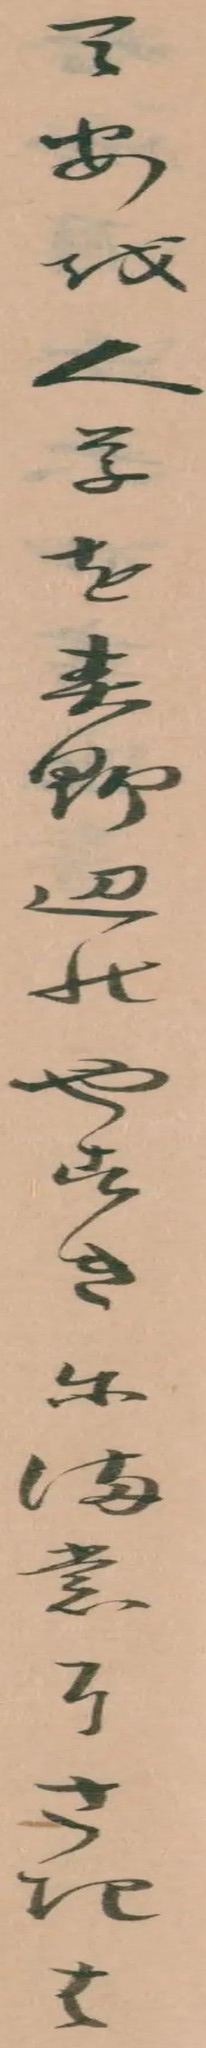てあを人草を春野辺のやすきにまもにさきは
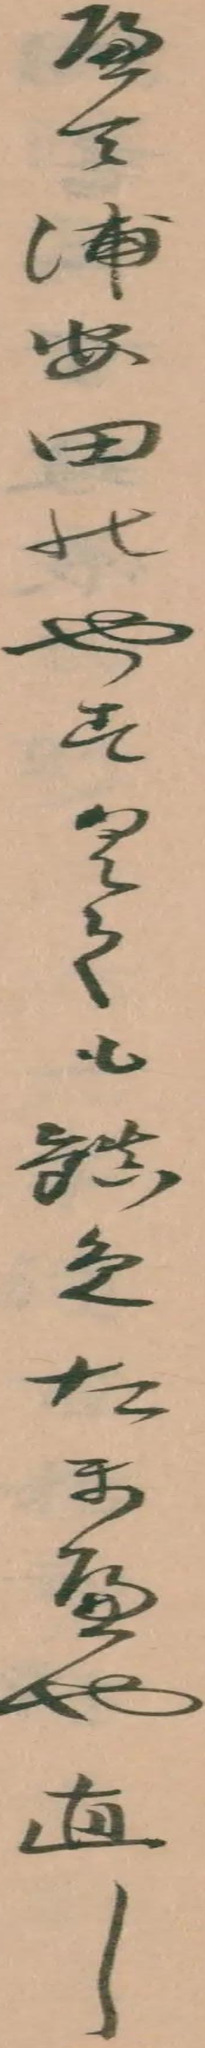へて浦安田のやすくても鎮めたまへや直し
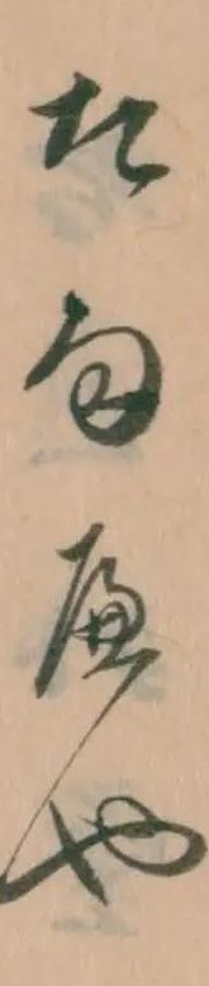たまへや
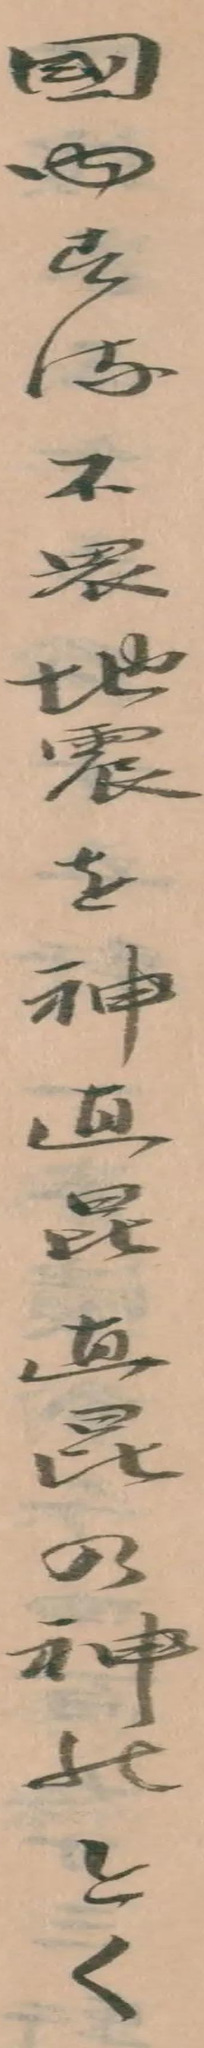国ゆする不畏地震を神直昆直昆の神のとく
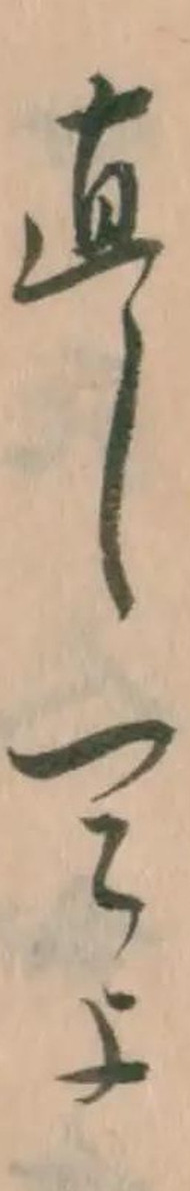直してよ
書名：地災撮要. 巻5-6(地震之部)
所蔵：国立国会図書館 National Diet Library, JAPAN
